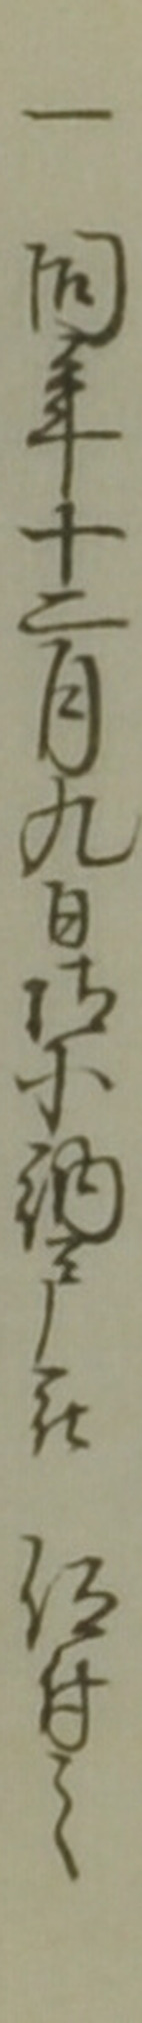一同年十二月九日御小納戸被仰付之
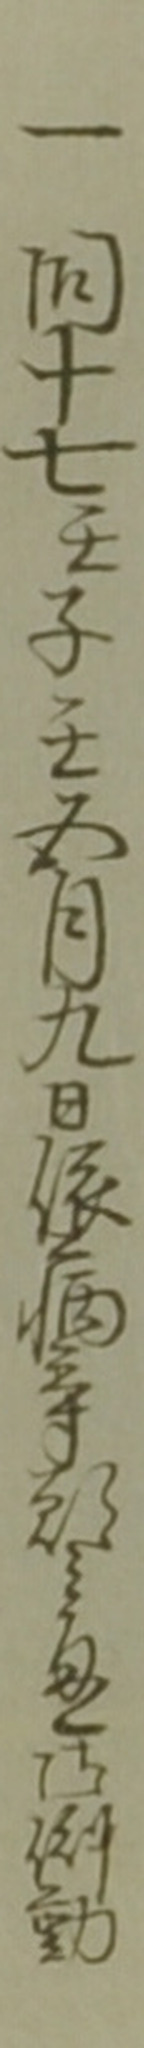一同十七壬子閏五月九日依病気願之通御側勤
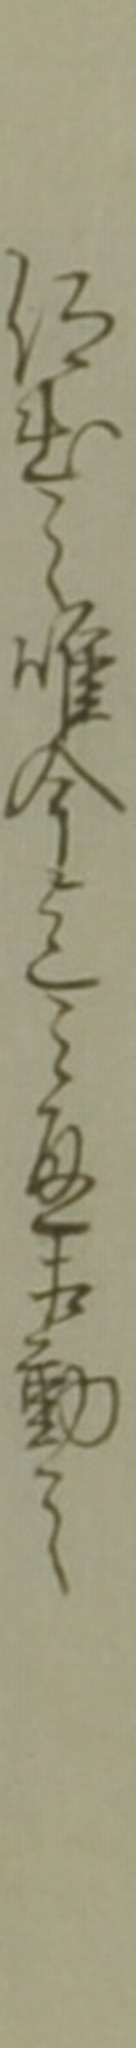仰付之唯今迄之通相勤之
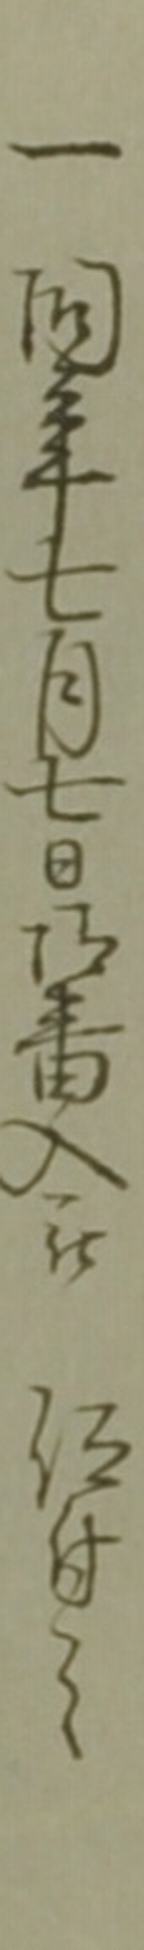一同年七月七日御番入被仰付之
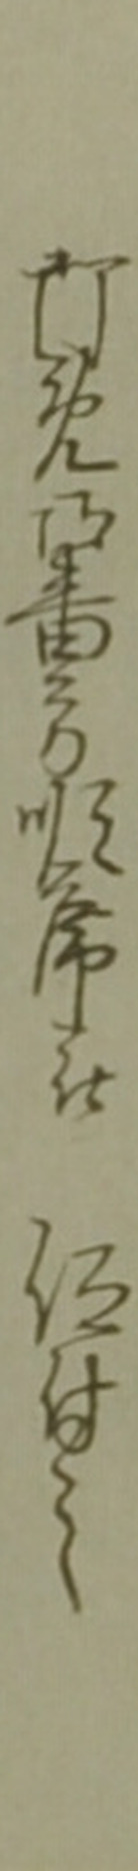御免御番方順席被仰付之
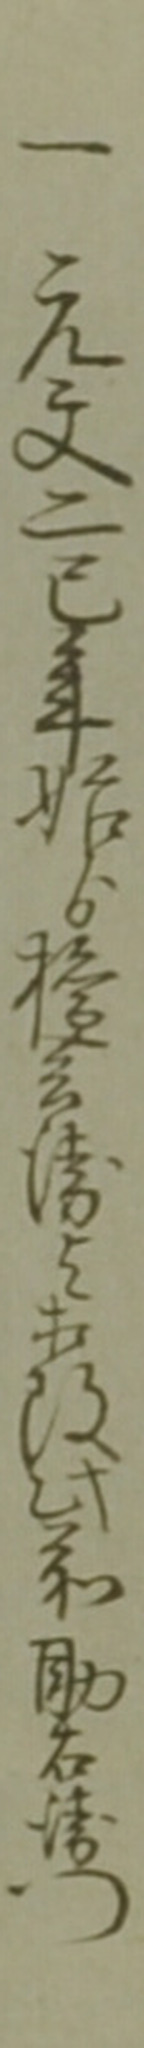一元文二丁巳年始ゟ権兵衛と相改此前助右衛門
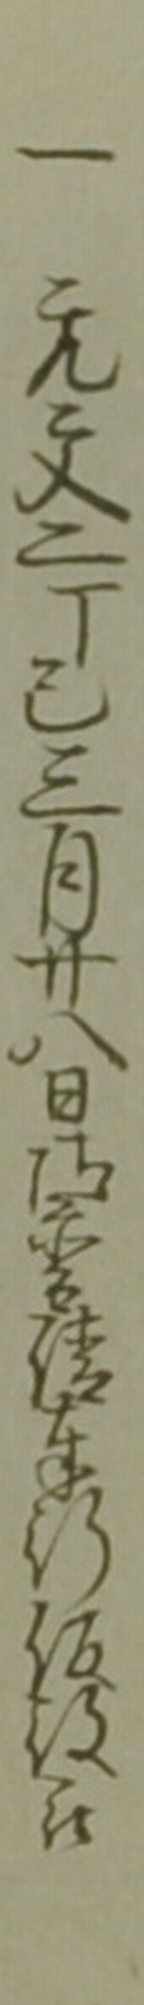一元文二丁巳三月廿八日御普請奉行仮役被
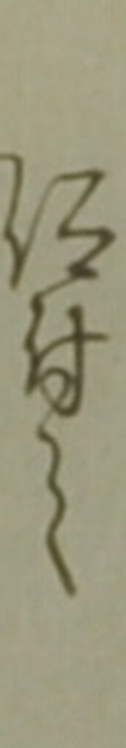仰付之
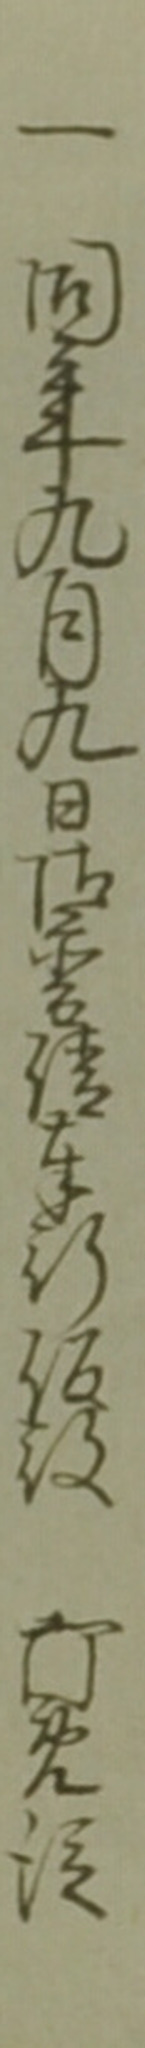一同年九月九日御普請奉行仮役御免従
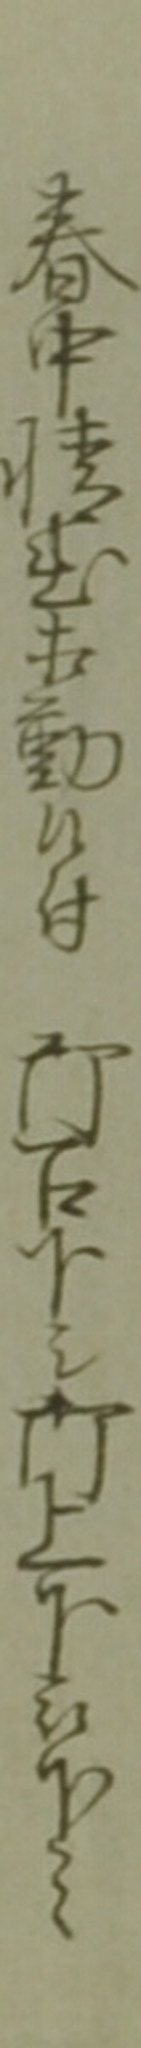春中情出相勤候付御召下シ御上下被下之
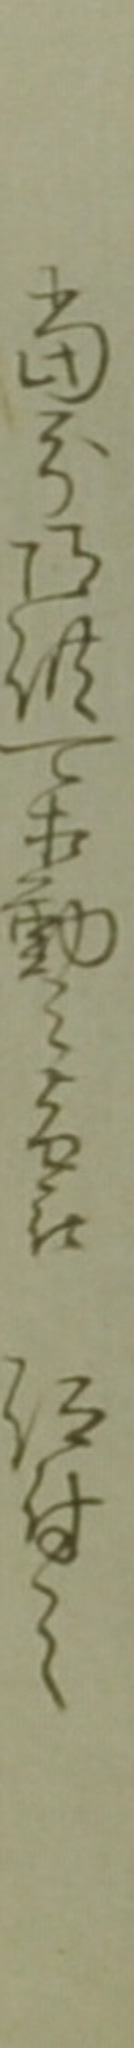当分御供可相勤之旨被仰付之
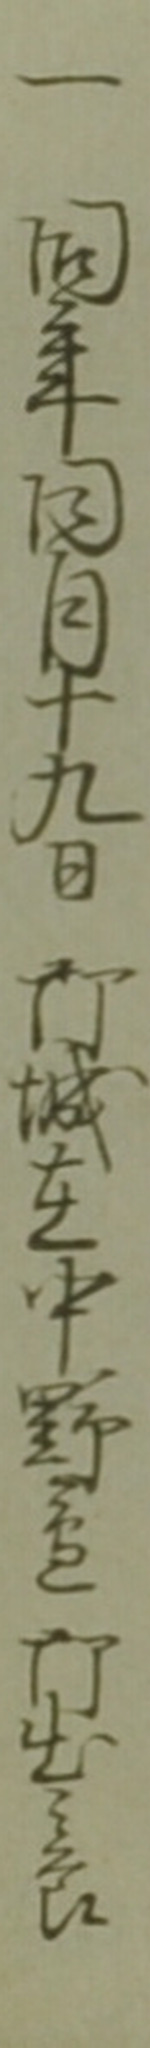一同年同月十九日御城在中野辺御出之節
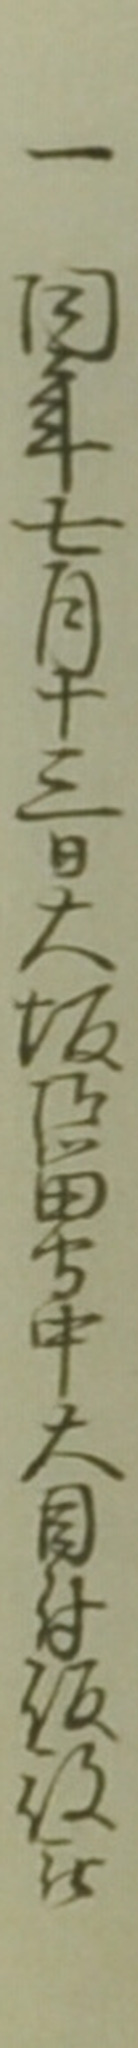一同年七月十三日大坂御留守中大目付仮役被
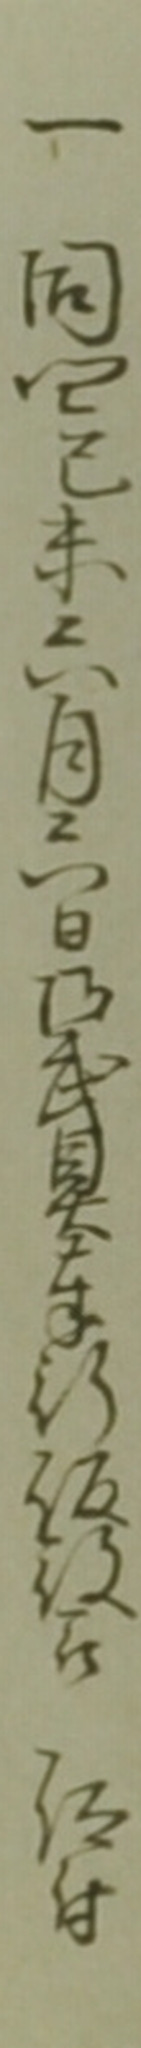一同四己未六月六日御武具奉行仮役被仰付

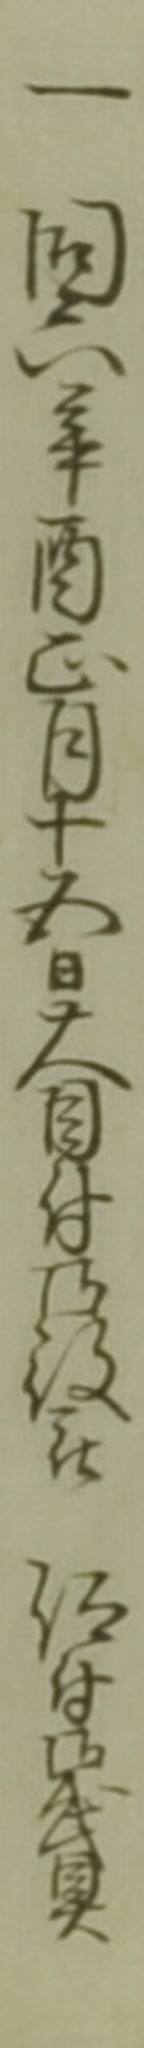一同六辛酉正月十五日大目付御役被仰付御武具
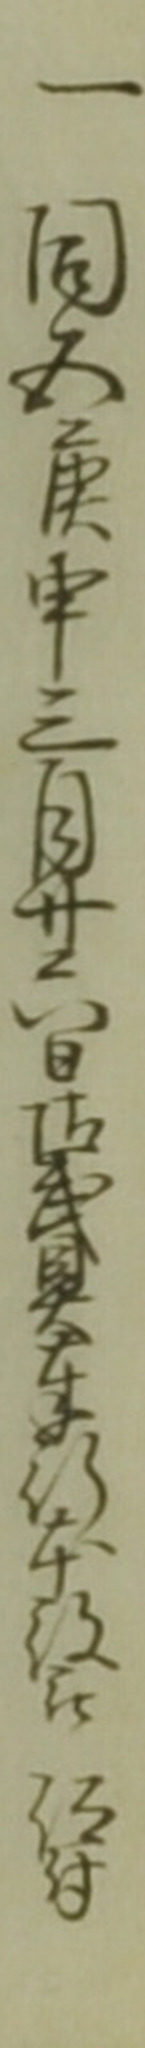一同五庚申三月廿六日御武具奉行本役被仰付
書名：給人諸士勤仕録（三）
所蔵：伊那市立高遠町図書館・合同会社AMANE
